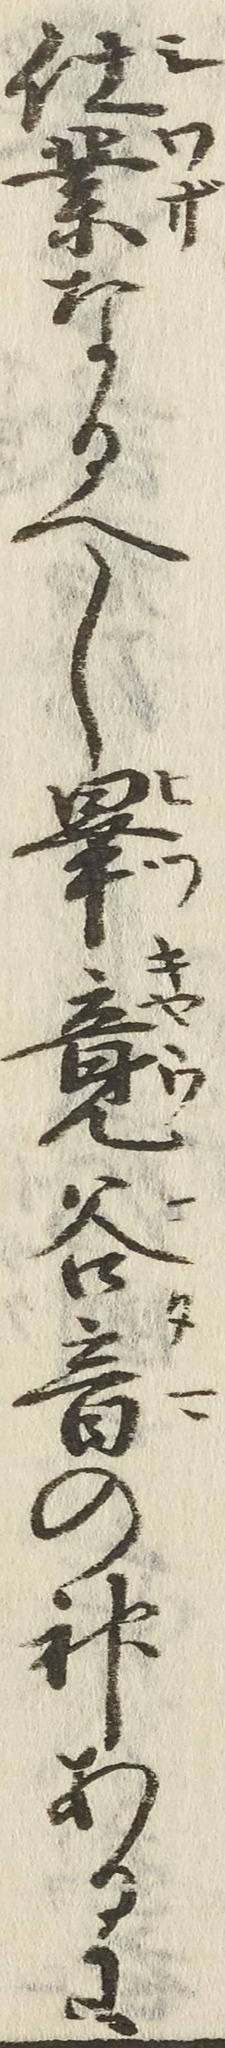仕業なるへし畢竟谷音の神あるに
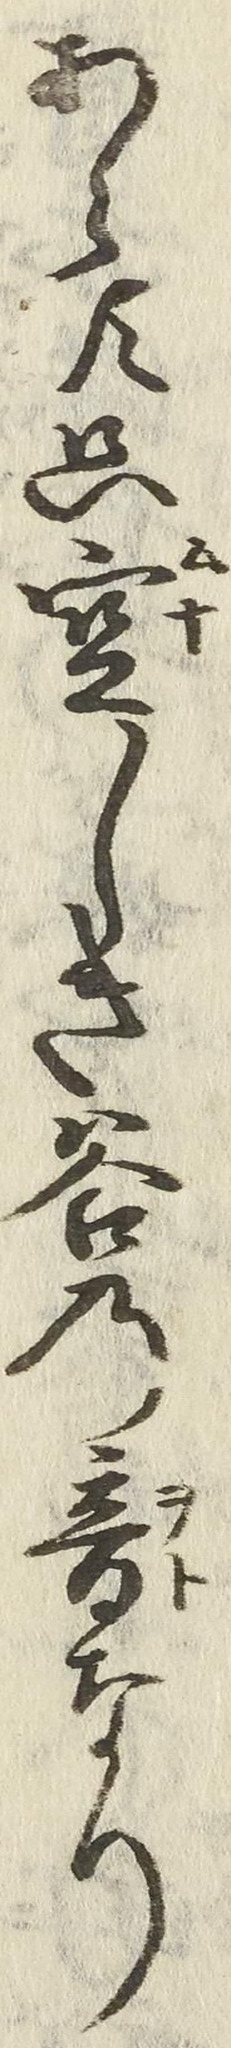あらす只空しき谷の音なり
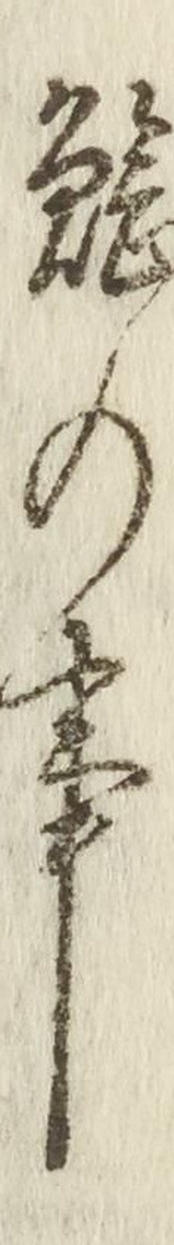鯰の事
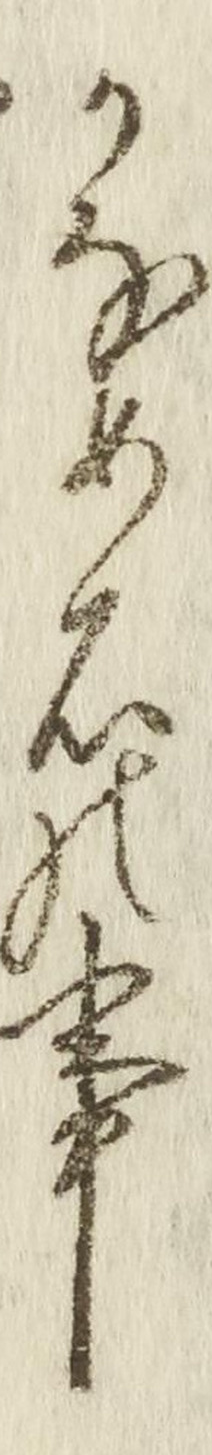かなめ石の事
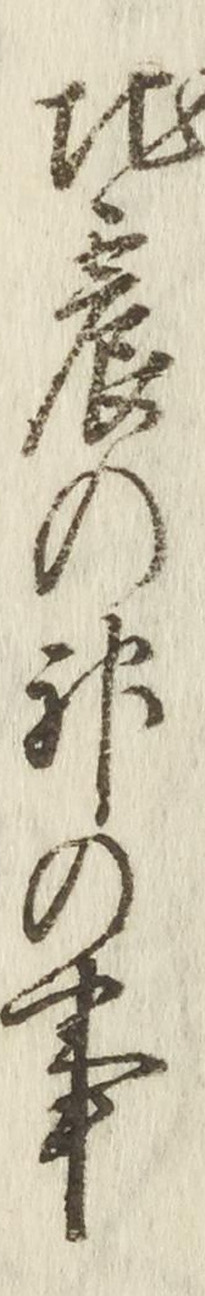地震の神の事
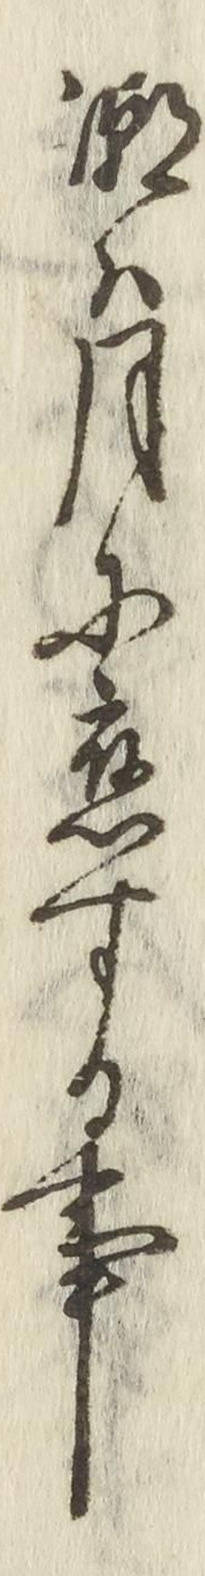潮は月に応する事

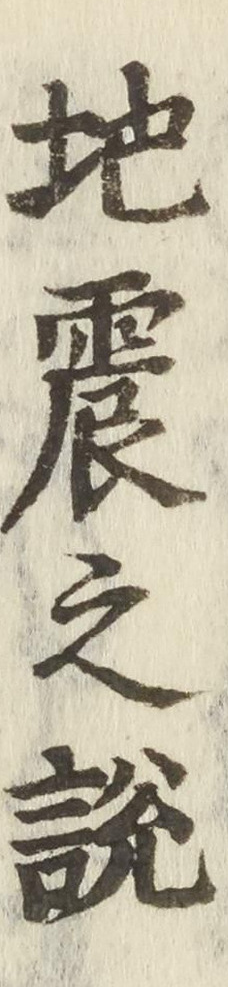地震の説
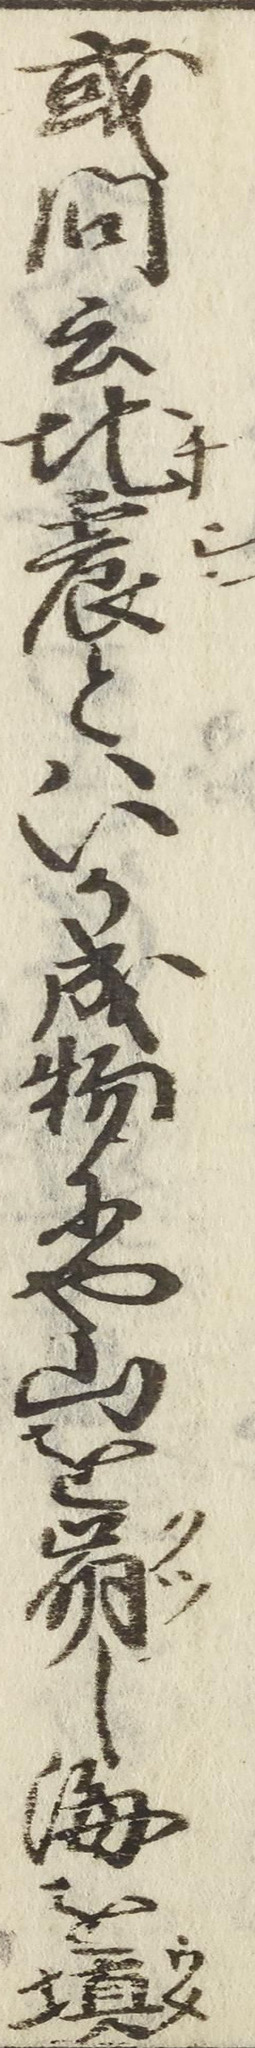或問云地震とはいか成物にや山を崩し海を填
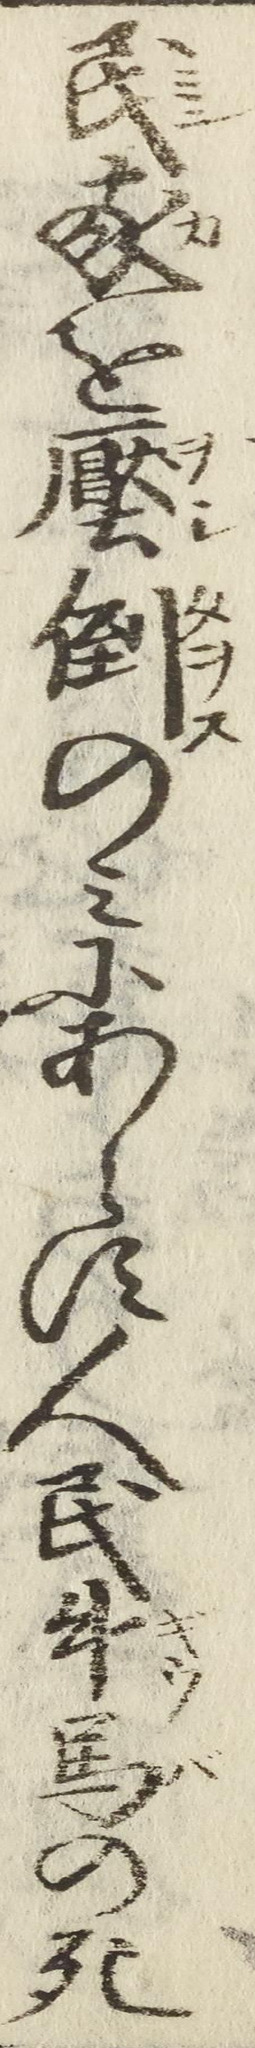民家を圧倒のみにあらす人民牛馬の死
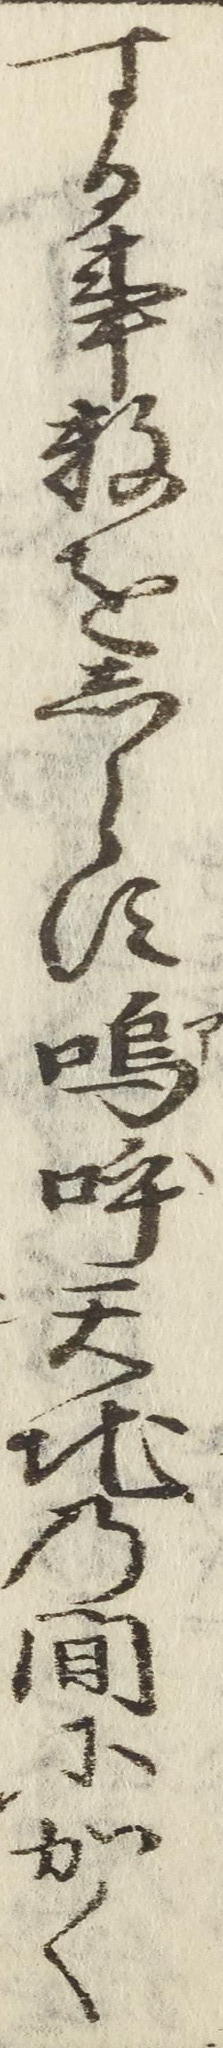する事数をしらす嗚呼天地の間にかく
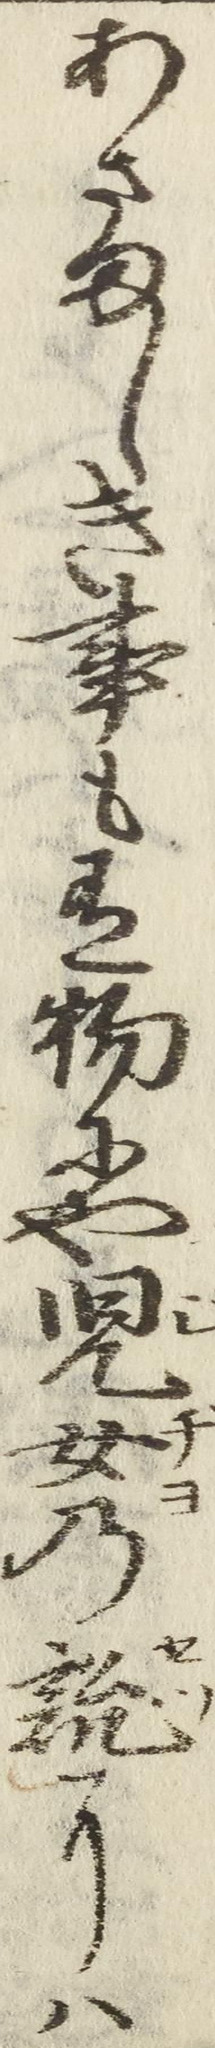あさましき事も有物にや児女の説には
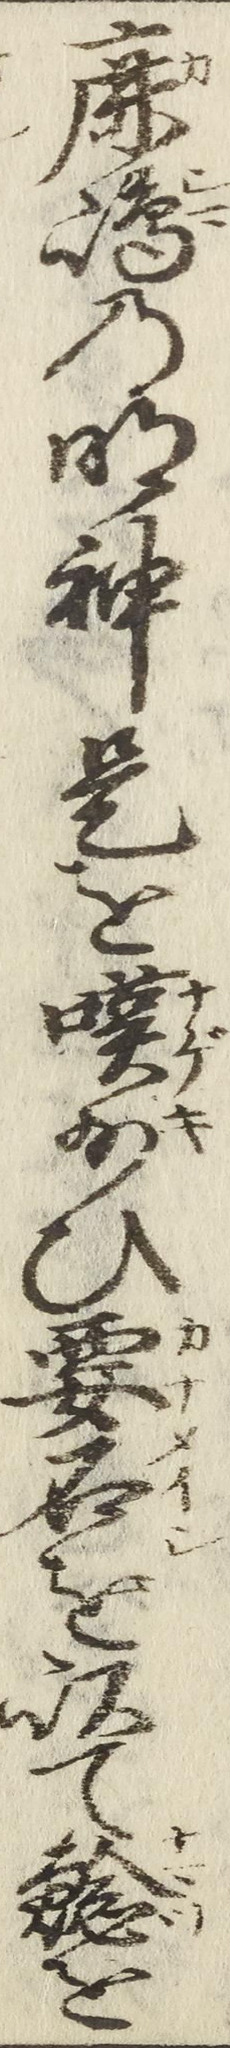鹿嶋の明神是を嘆給ひ要石を以て鯰を
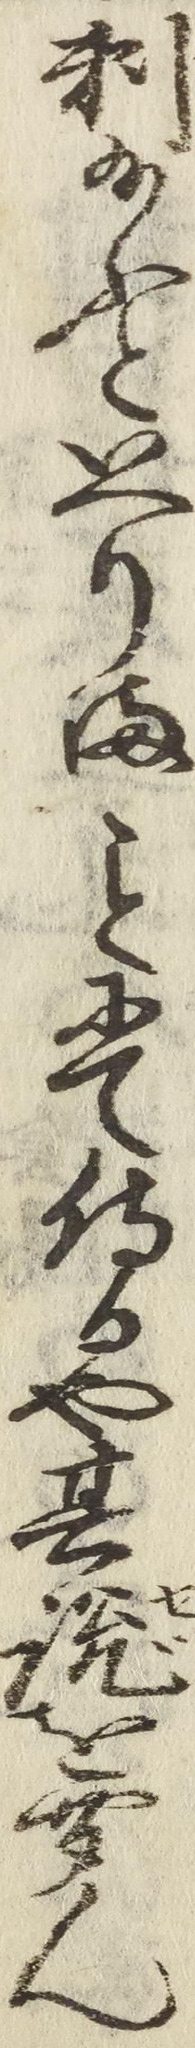刺給ふといへりまことにて侍るや其説を聞ん

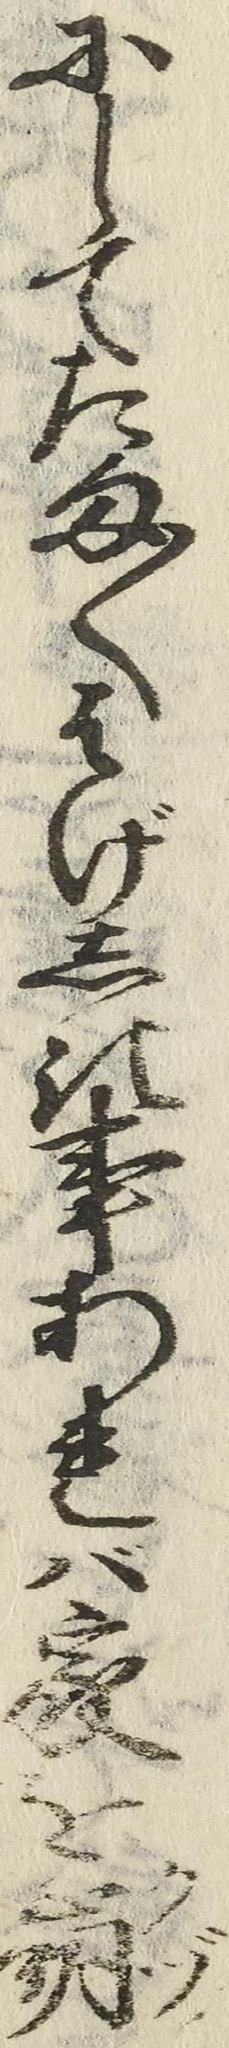にしてたま〳〵はげしき事あれば家を崩
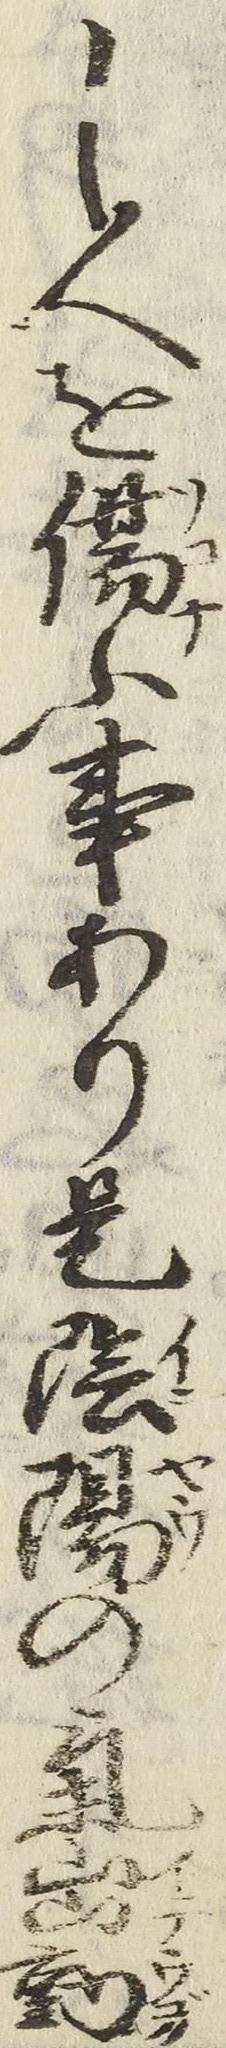し人を傷ふ事あり是陰陽の気出動
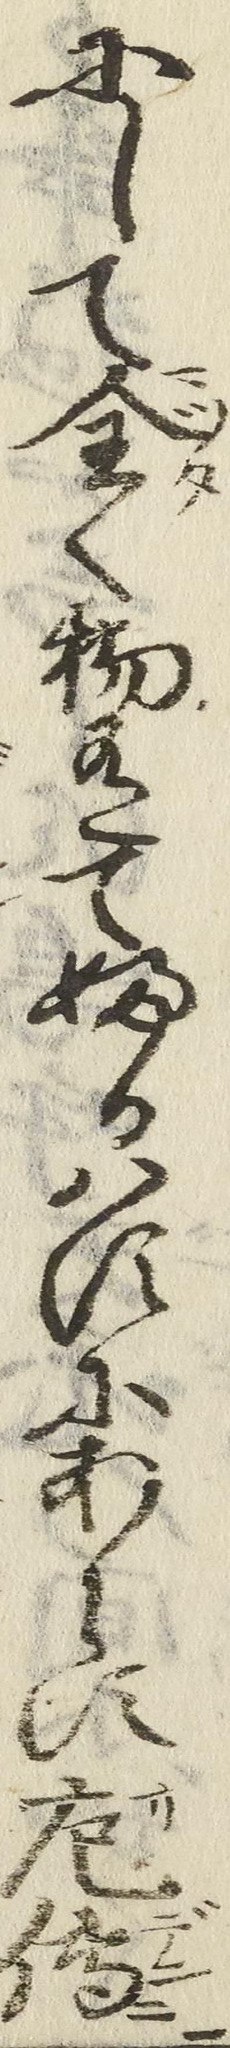にして全く物有てふるはすにあらす左伝ニ
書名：天地或問珍　天
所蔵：東京大学地震研究所図書室 Earthquake Research Institute Library, The University of Tokyo, JAPAN
